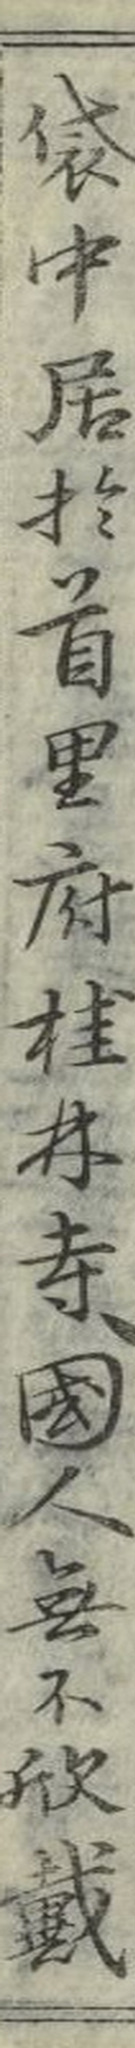袋中居於首里府桂林寺、国人無不欣戴
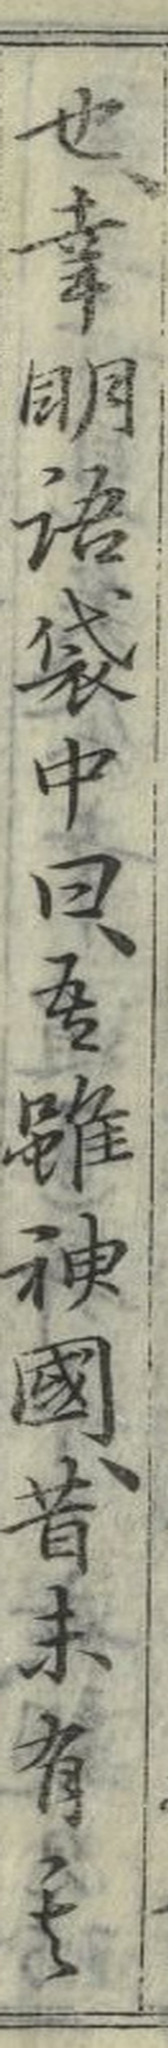也、幸明語袋中曰、吾雖神国、昔未有其
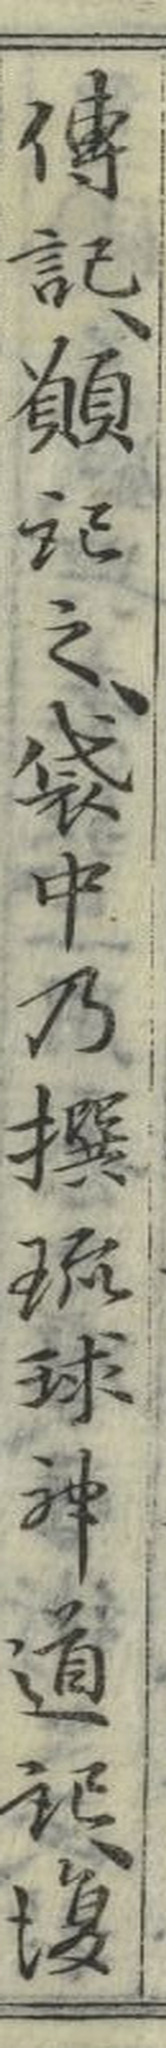伝記、䫟記之、袋中乃撰琉球神道記、復
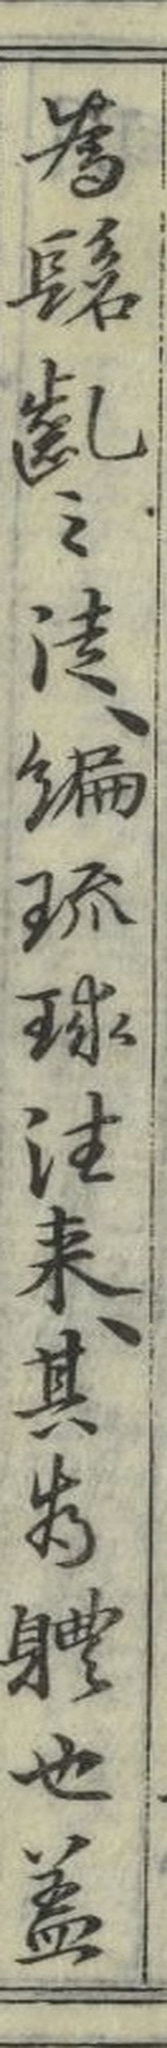為騞乱之徒、編琉球往来、其為体也蓋
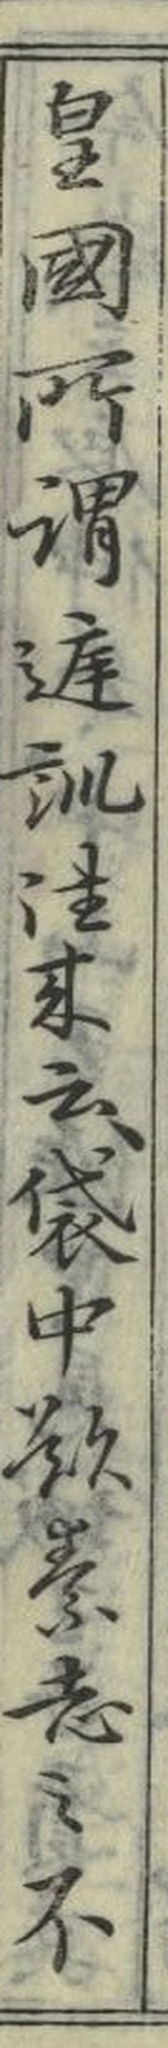皇国所謂逓訓往来云、袋中欲素志之不
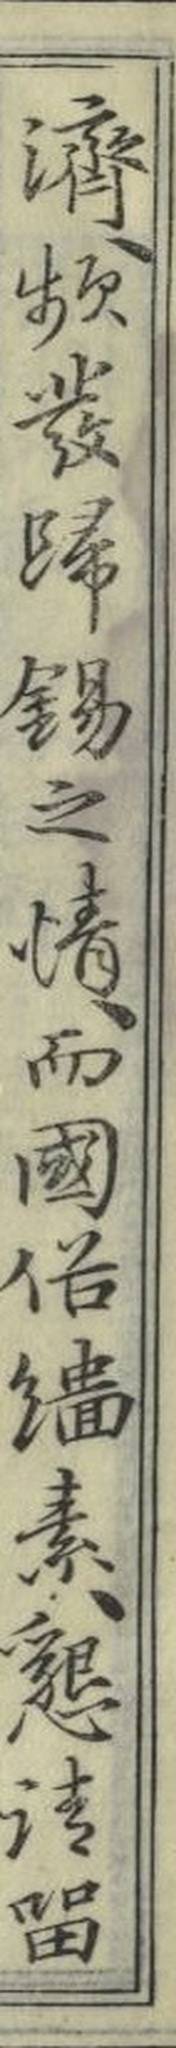済、頻発帰錫之情、而国俗繬素、懇請留
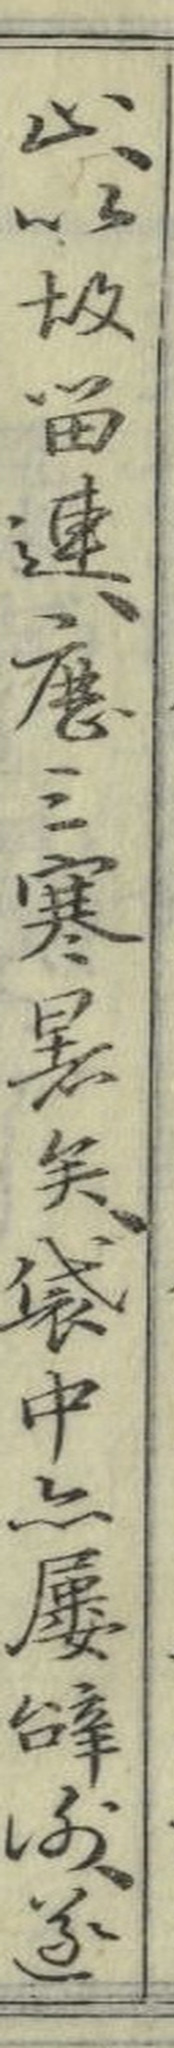止、以故留連、応三寒暑矣、袋中亦屢辝浅、遂
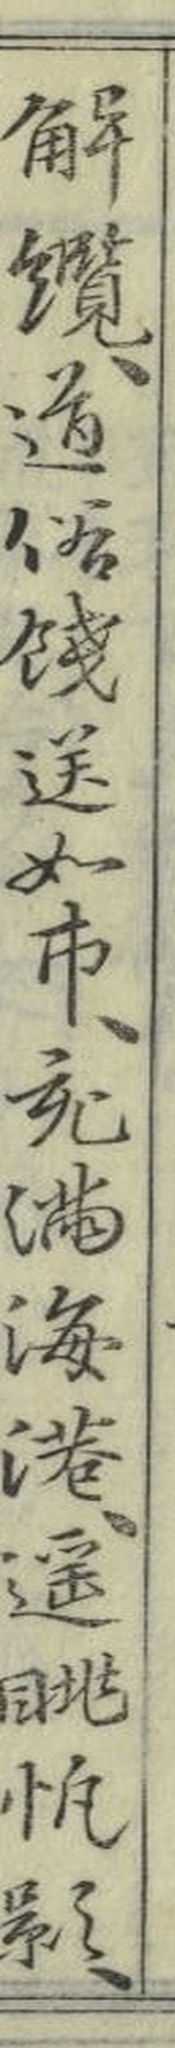解鑬、道俗餞送如市、充満海港、遥眺帆影、
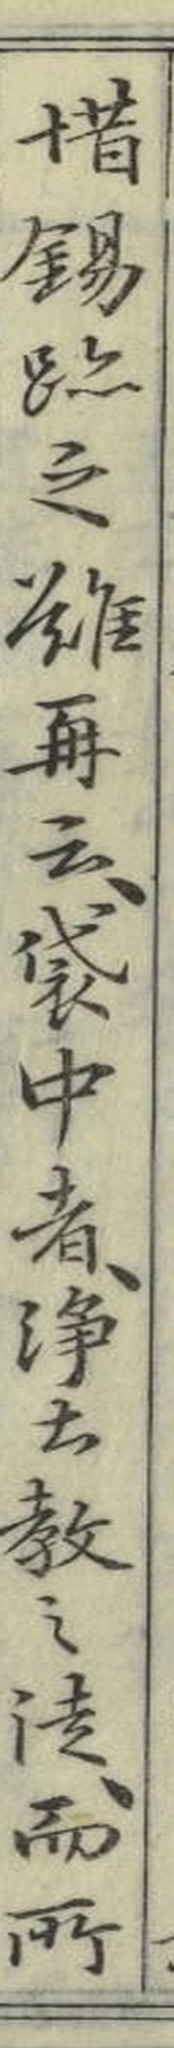惜錫跡之雖再云、袋中者、浄土教之徒、而所
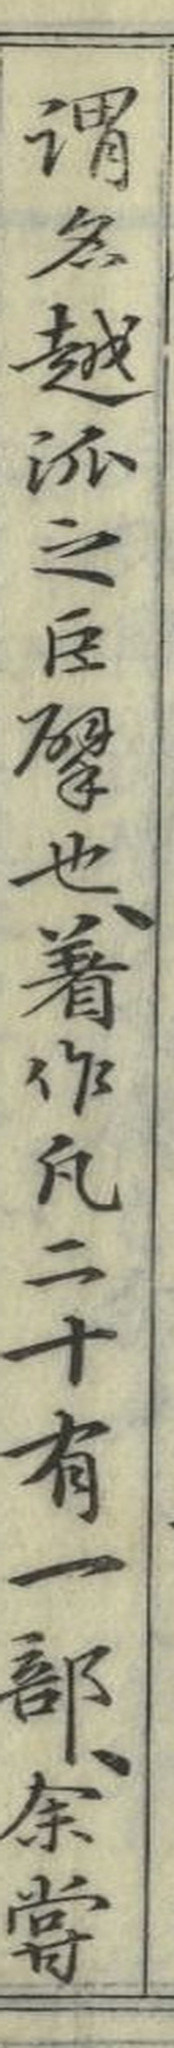謂名越派之臣擘也、着作凡二十有一部、余嘗
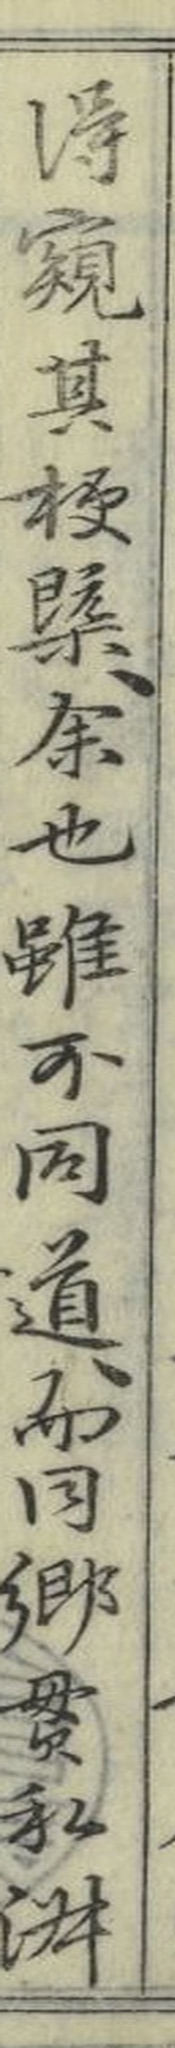得窺其梗概、余也雖不同道、而同郷貫私汫
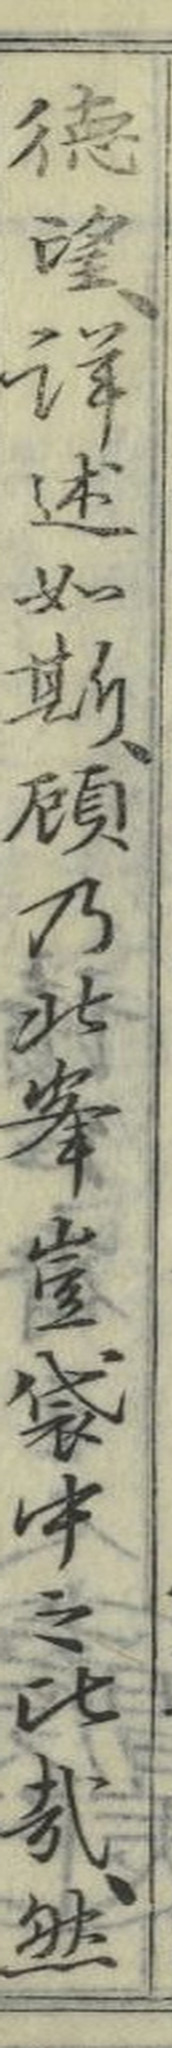徳望、詳述如斯、碩乃北峰豈袋中之比哉、然
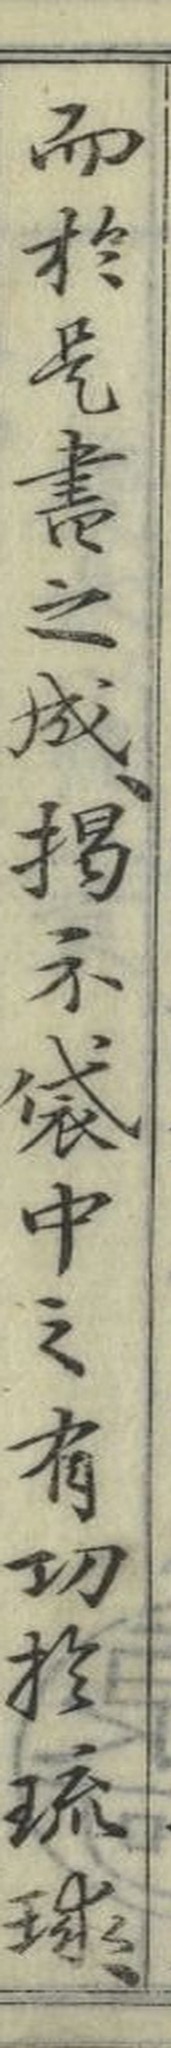而於是書之成、掲示袋之有功於琉球、
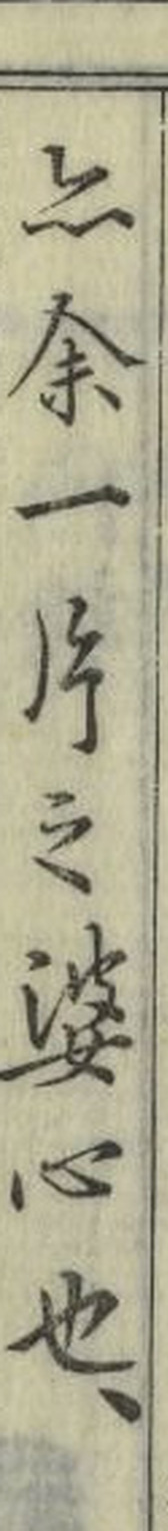亦余一片之婆心也、
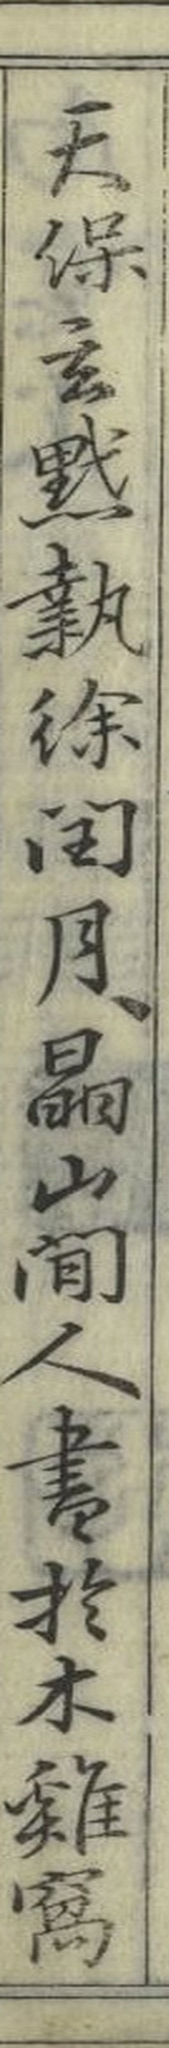天保玄黙執徐閏月、晶山間人書於木雞窩

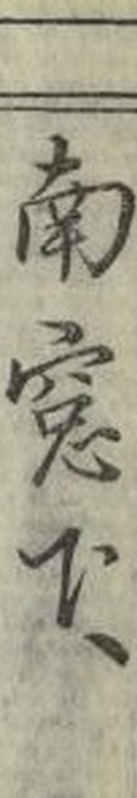南窓下、
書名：琉球入貢紀畧
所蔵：University of the Ryukyus Library
